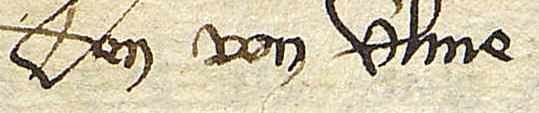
Den von Vlme
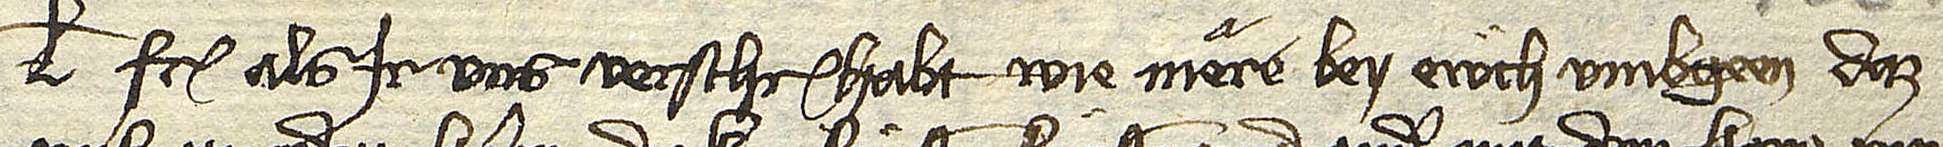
L* fr* als Ir vns verſchr* habt wie mëre bey ewch vmbgeen daʒ
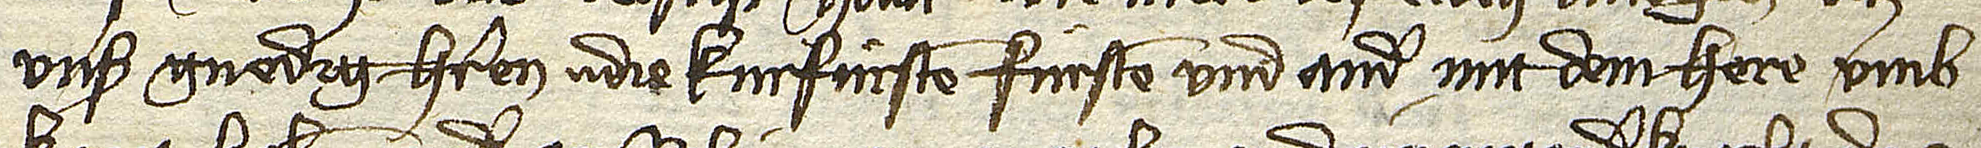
vnſ* gnedig h*ren ~die kurfürſte* fürſte* vnd and* mit dem here vmb
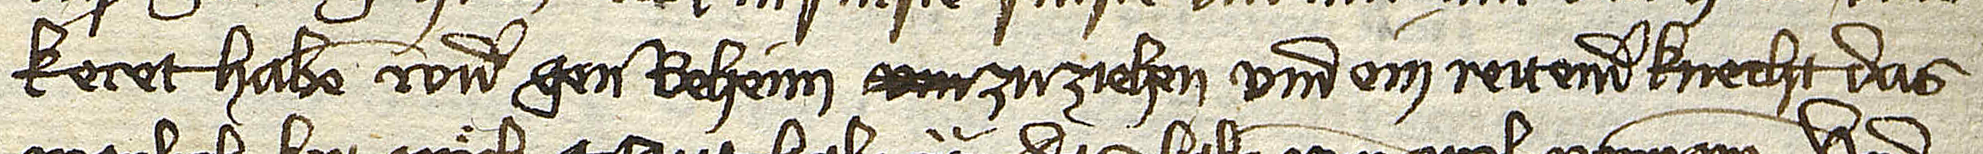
keret habe* wid* gen Beheim vmʒuʒiehen vnd ein reitend* knecht das
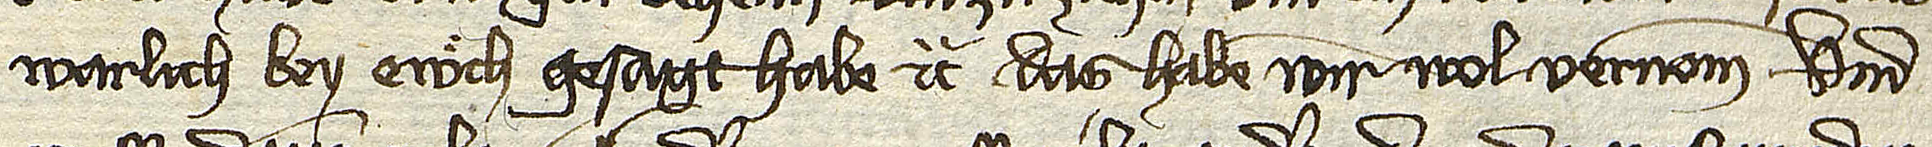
warlich bey ewch geſagt habe ec* / das habe* wir wol vernom* Vnd
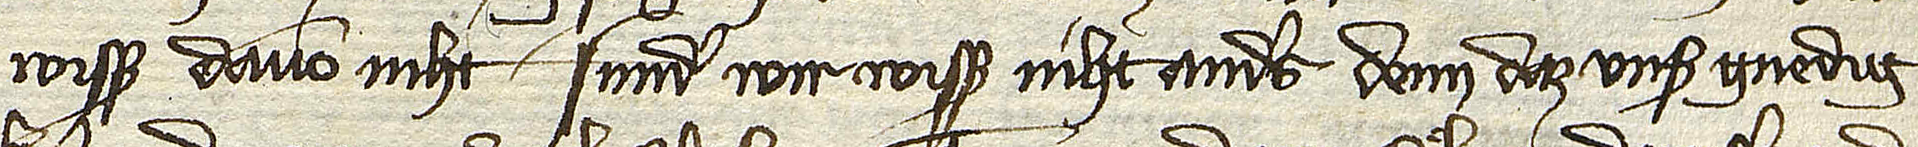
wiſſ* dauo* niht / ſund* wir wiſſ* niht and*s denn daʒ vnſ* gnedig
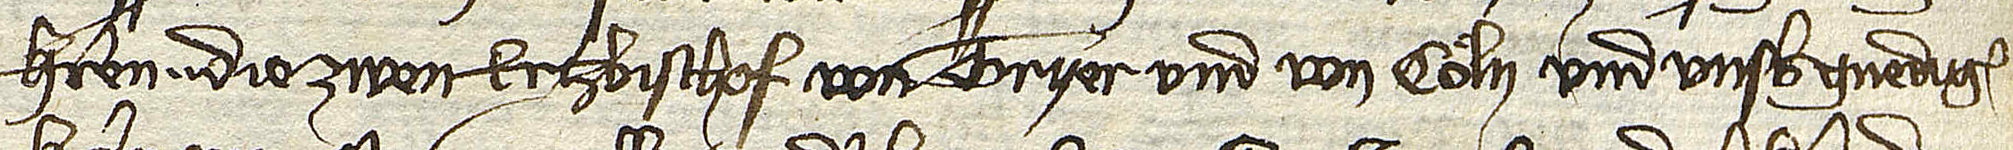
h*ren ~die ʒwen Ercʒbiſchof von Tryer vnd von Cöln vnd vnſ*s gnedig*
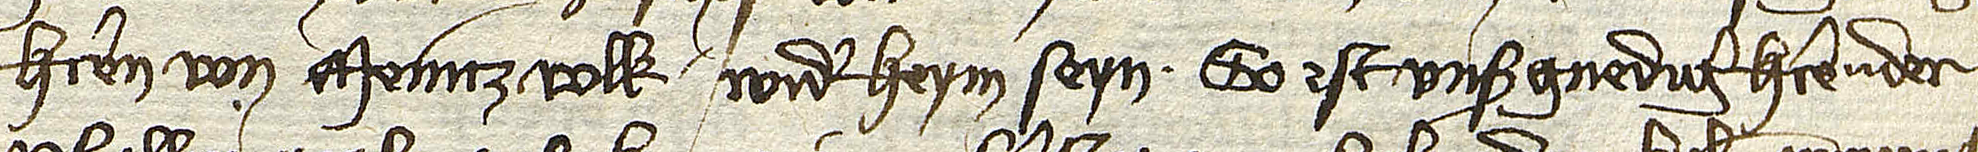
h*ren von Meincʒ volk / wid* heym ſeyn . So iſt vnſ* gnedig* h*re ~der
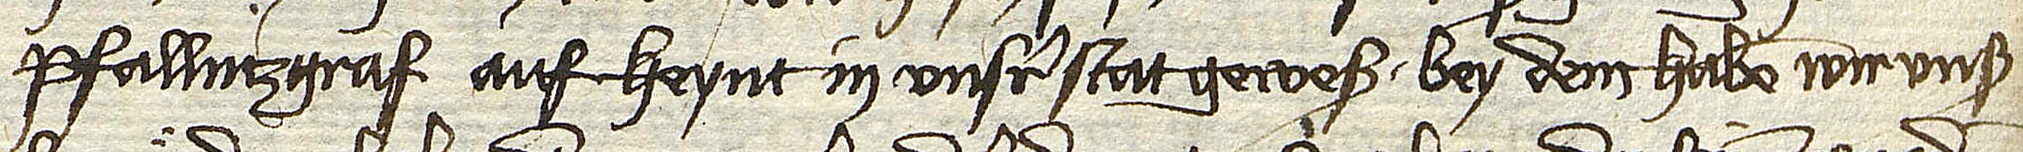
Pfallncʒgraf auf heynt in vnſ*r ſtat geweſ* . bey dem habe* wir vnſ*
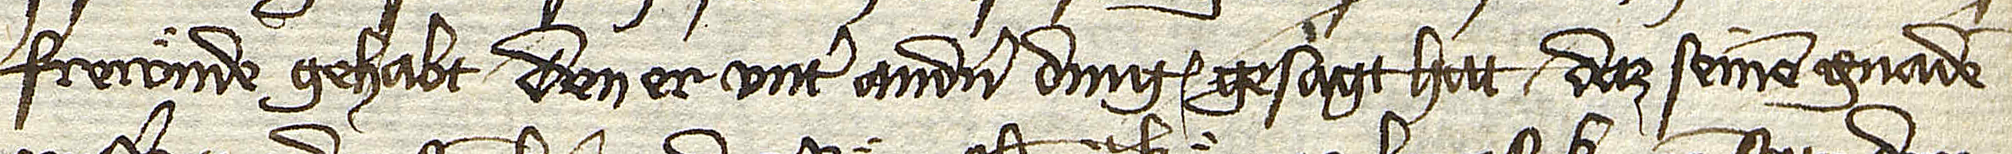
frewnde gehabt / Den er vnt* and*n ding* geſagt hat / daʒ ſeine* gnade*
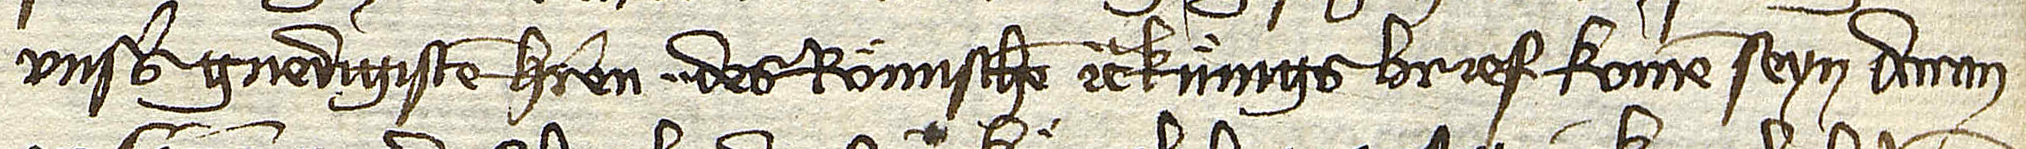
vnſ*s gnedigiſte* h*ren ~des Römiſche* ec* künigs brief kome* ſeyn daran
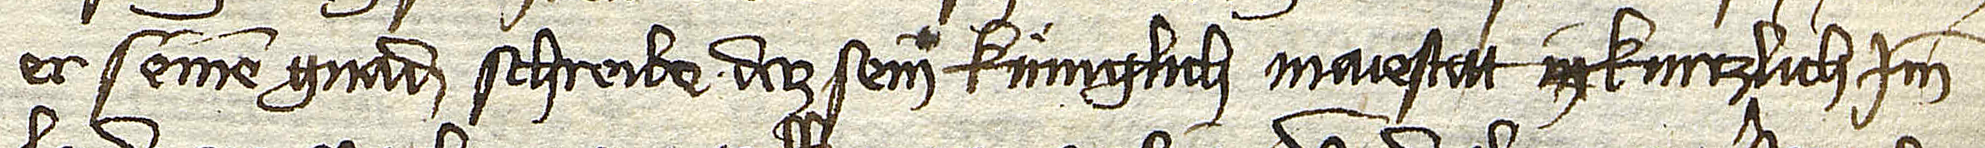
er ſeine* gnad* ſchreibe . daʒ ſein küniglich maieſtat in kurcʒlich Im*
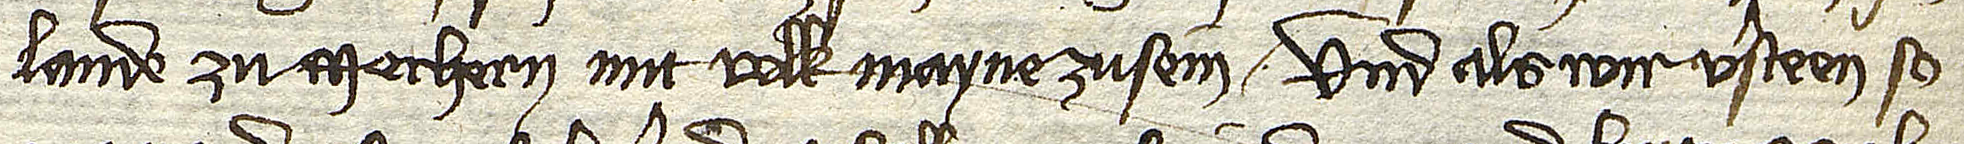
lande ʒu Merhern mit volk mayne ʒu ſein / Vnd als wir v*ſteen ſo
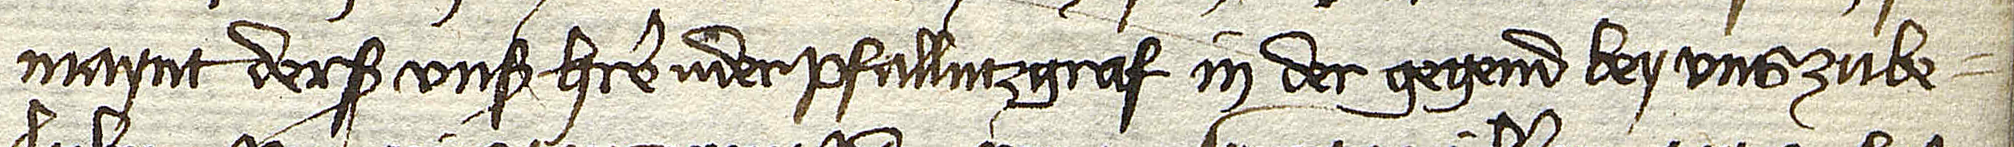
maynt derſ* vnſ* h*re ~der pfallncʒgraf in der gegend bey vns ʒube =
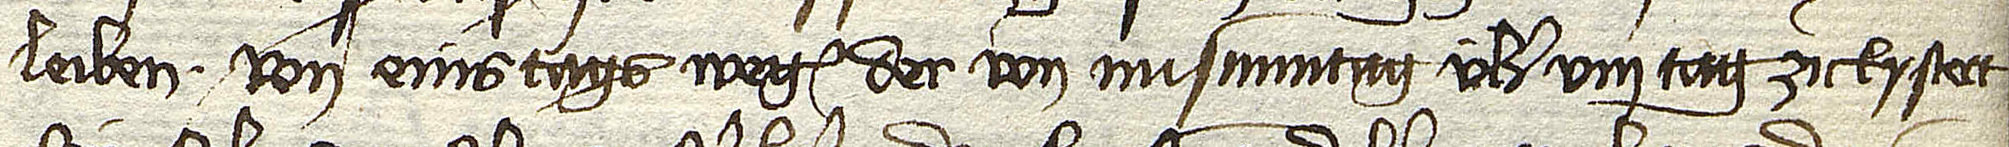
leiben . von eins tags weg* der von nu ſunntag v̈b* viii tag ʒu Eyſtett
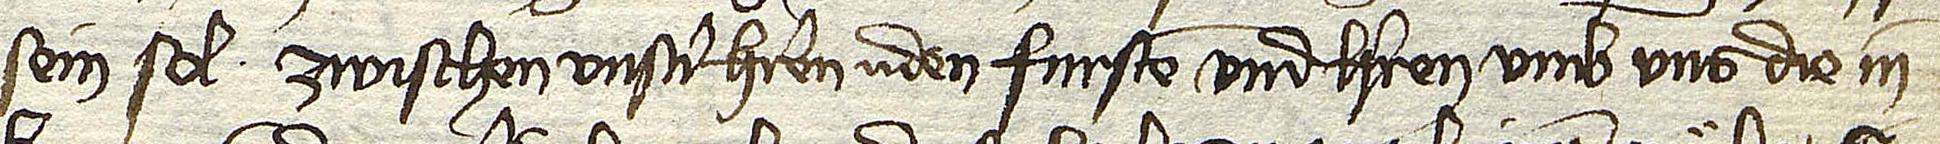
ſein ſol . ʒwiſchen vnſ*n h*ren ~den furſte* vnd h*ren vmb vns die in
